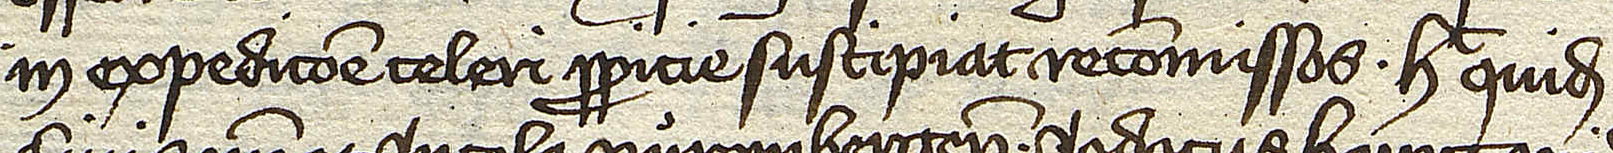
in expedic*o*e celeri ppicie* ſuſcipiat reco*miſſos . H*c quid*
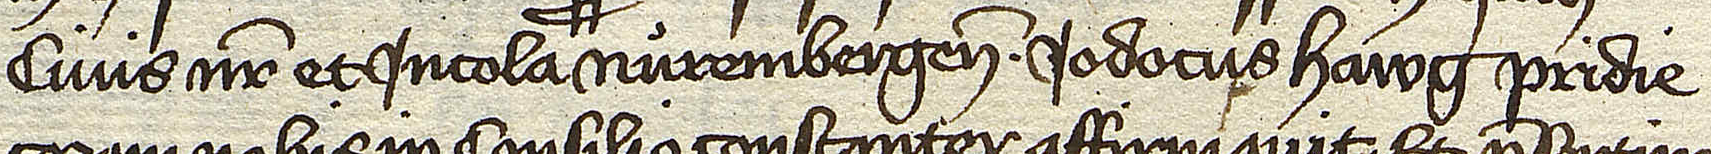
Ciuis n*r et Incola Nürembergen* . Iodocus Hawg pridie
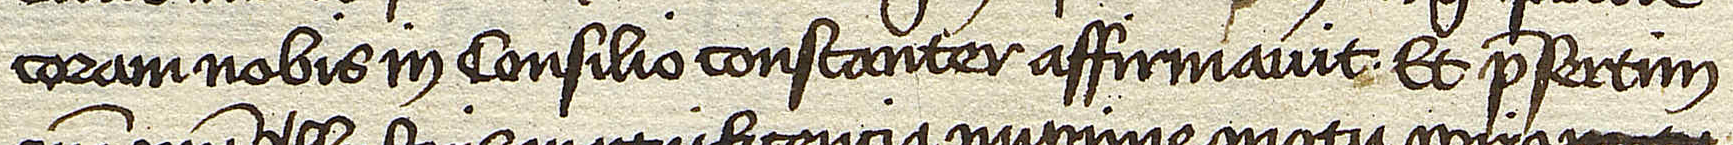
coram nobis in Conſilio conſtanter affirmauit . Et p*ſertim
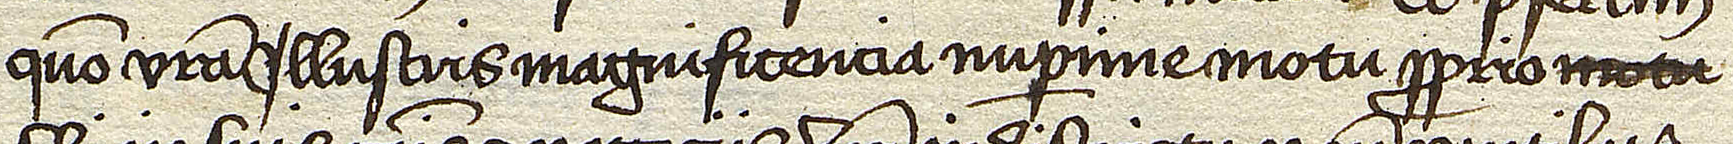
quo* v*ra Illuſtris magnificencia nup*ime motu p*prio motu
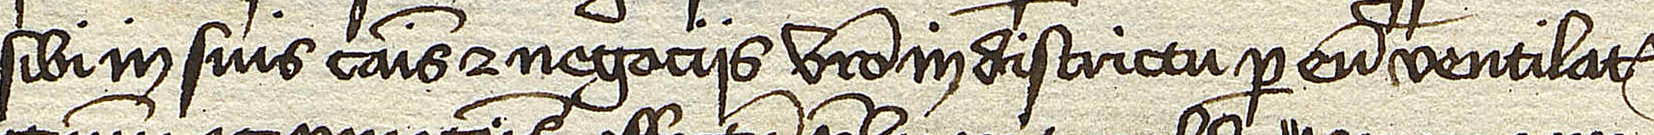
ſibi in ſuis ca*is @ negociis v*ro in diſtrictu p* eu* ventilat*
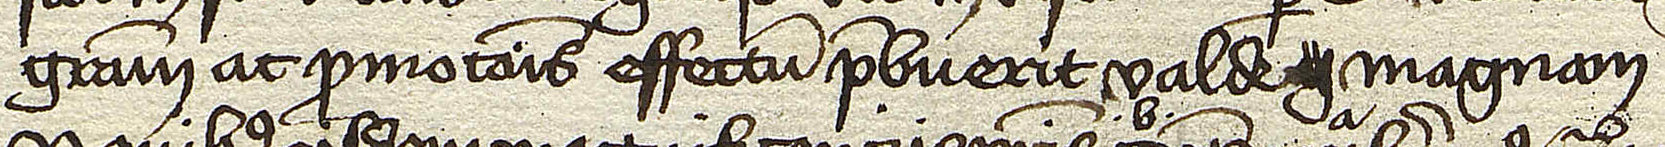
gra*m ac p*moc*o*is effectu* p*buerit valde g magnam
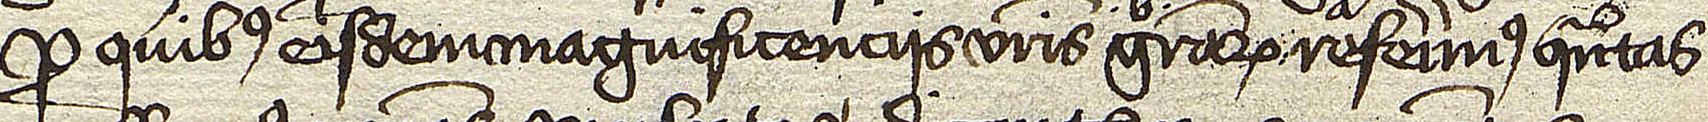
p* quib* eiſdem magnificenciis v*ris gra* refe*im* qu*tas
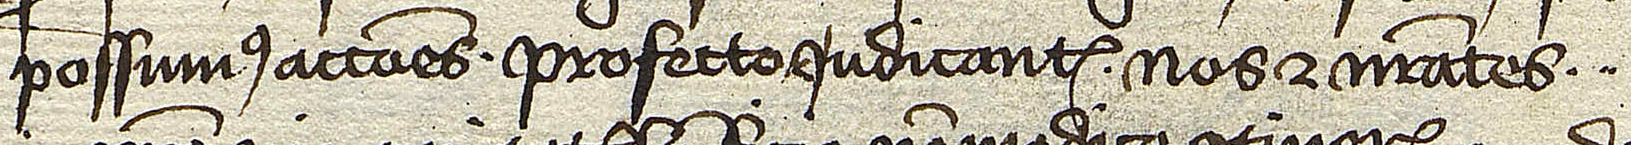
poſſum* act*o*es profecto Iudicant* . Nos @ n*rates . .
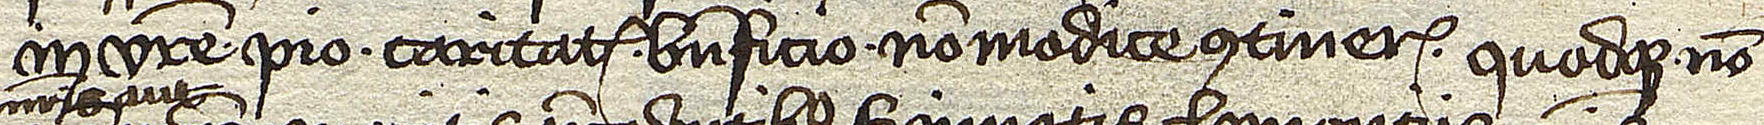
in v*re pio . caritat* . b*n*ficio . no* modice *tiner* . quodq* no*
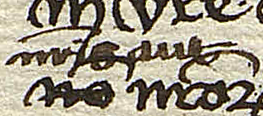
n*ris aut
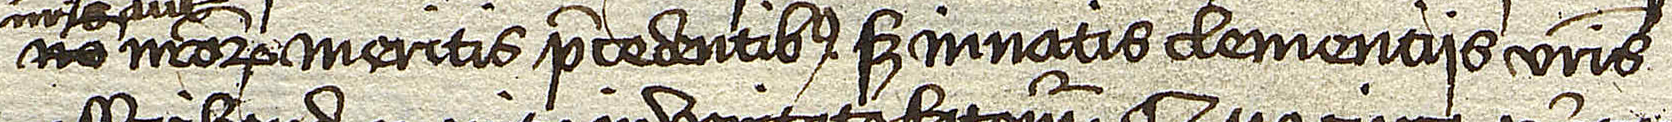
no n*ro* meritis p*cedentib* ſ* innatis clemenciis v*ris
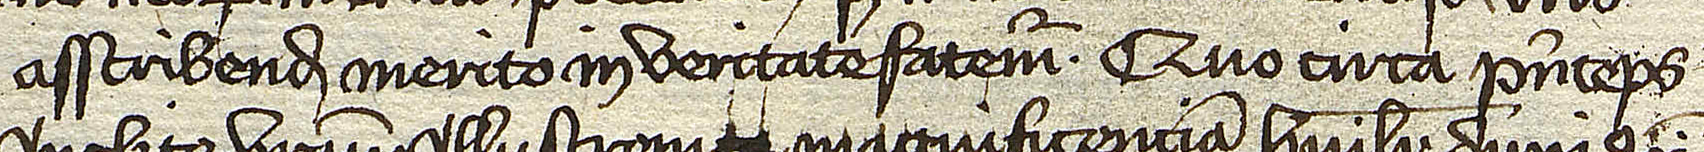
aſſcribend* merito in veritate fatem* . Quo circa p*nceps
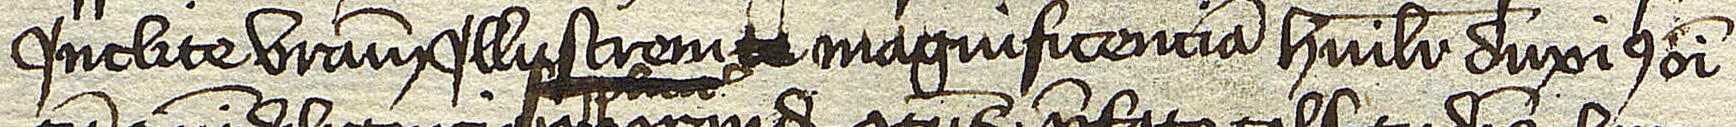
Inclite v*ram Illuſtrem te magnificencia* hu*il*r duxi* o*i
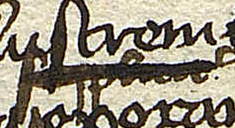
ſupplicant*
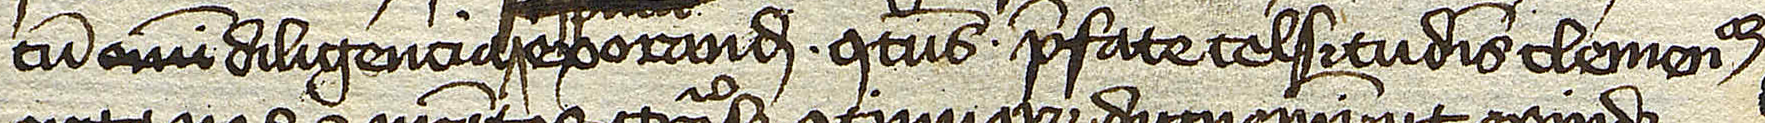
cu* oiui diligencia exorand* . *t*us . p*fate celſitudi*s clemen*
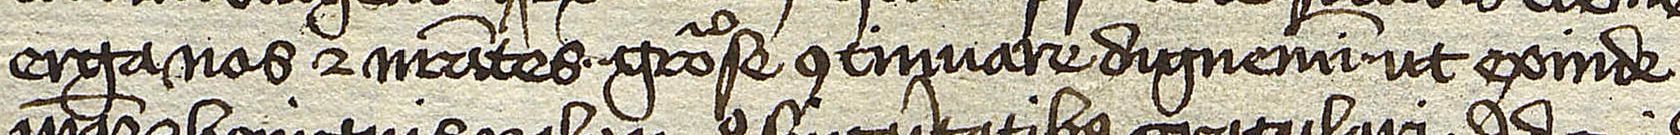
erga nos @ n*rates g*roſe *tinuare dignemi* ut exinde
